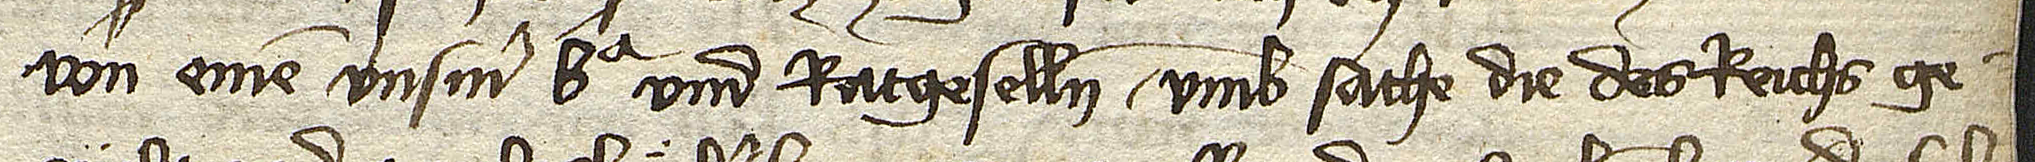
von eine* vnſm* b* vnd Ratgeſelln* / vmb ſache die des Reichs ge =
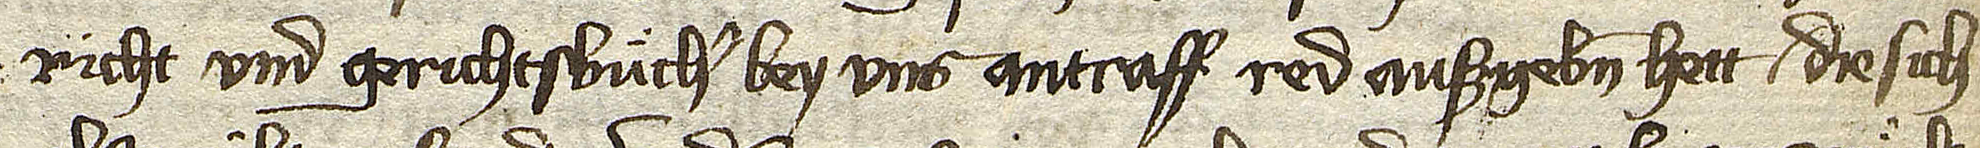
richt vnd gerichtſbüch* bey vns antraff red auſʒgebn* hett / die ſich
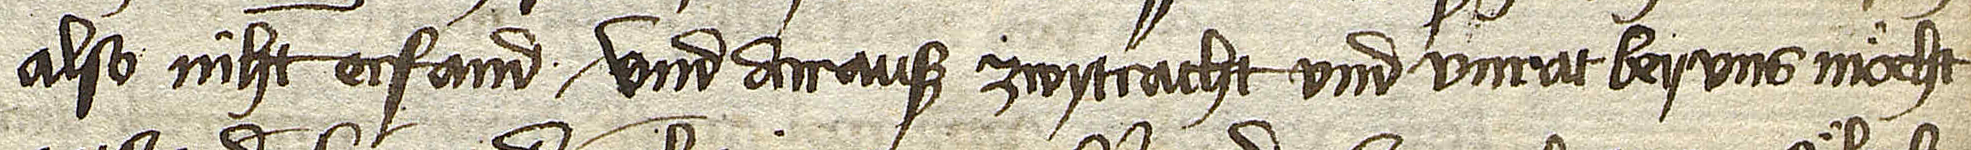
alſo niht erfand / vnd darauſʒ ʒwytracht vnd vnrat bey vns möcht
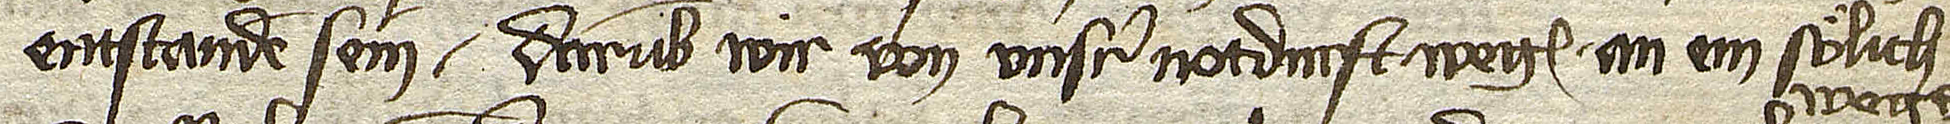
entſtande* ſein / Darub* wir von vnſr* notdurft weg* / an ein ſölich
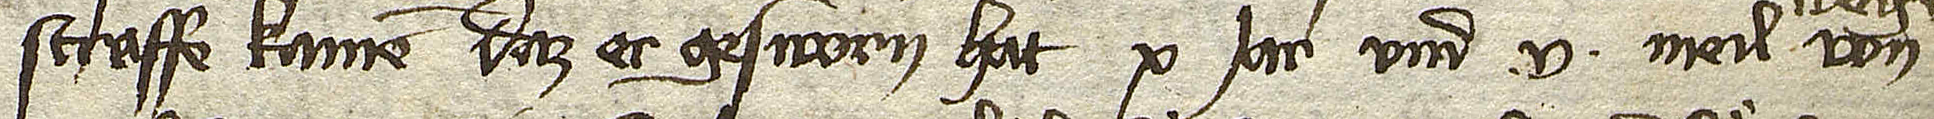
ſtraffe kume* daʒ er geſworn hat x Iar vnd . v . meil von
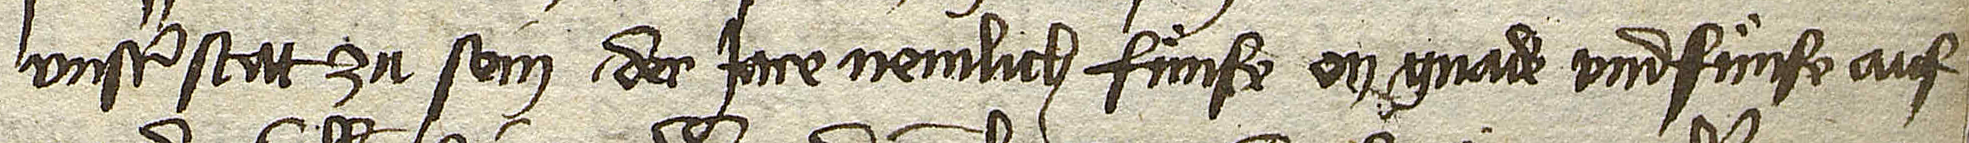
vnſr* ſtat ʒu ſein / der Iare nemlich fünfe on gnade vnd fünfe auf
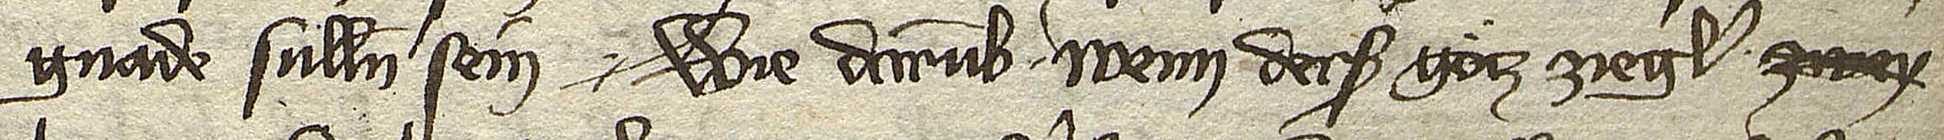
gnade ſulln* ſein / Wie darub* / wenn derſ* göcʒ ʒiegl* ʒwey
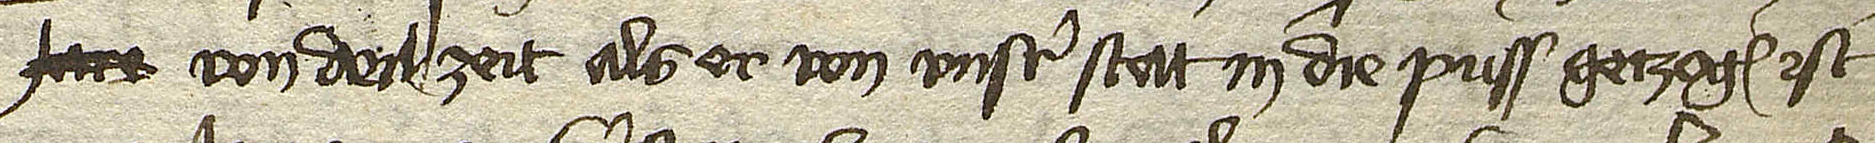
Iare von der ʒeit als er von vnſr* ſtat in die puſſ gecʒog* iſt
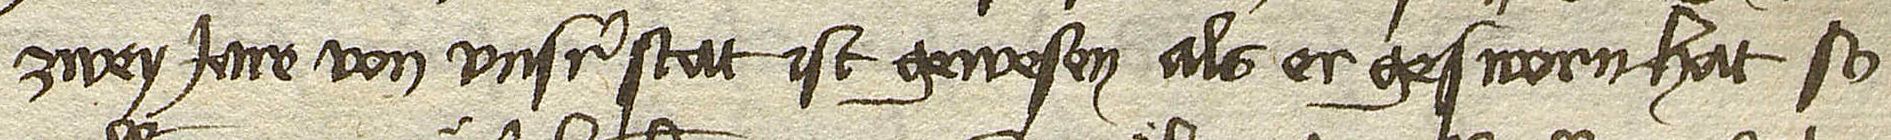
ʒwey Iare von vnſr* ſtat iſt geweſen als er geſworn hat ſo
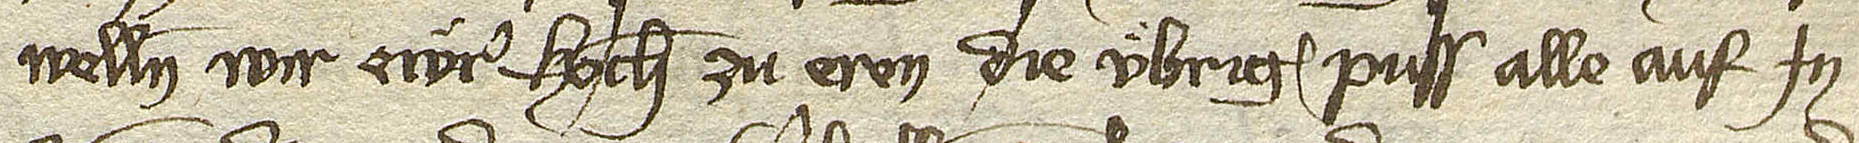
welln* wir eẅr* Hoch* ʒu eren die v̈brig* puſſ alle auf In
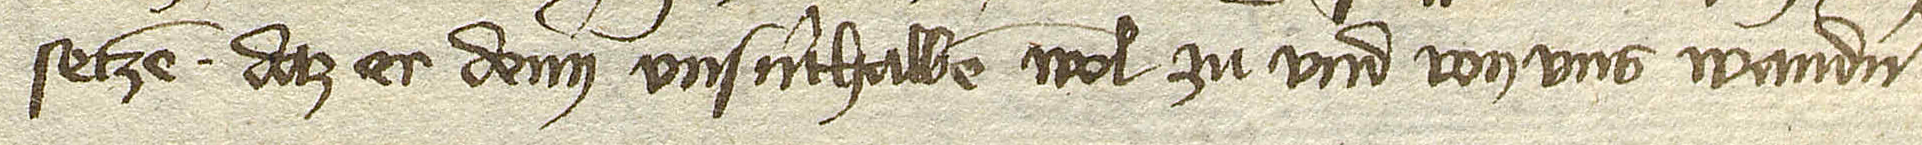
ſecʒe* . daʒ er denn vnſn*thalbe* wol ʒu vnd von vns wandn*
